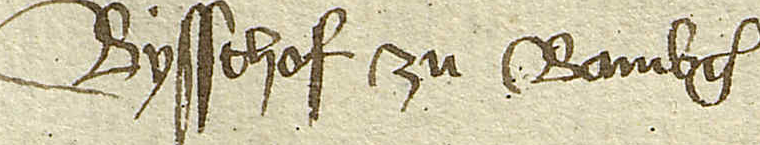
Byſſchof cʒu Bambg*
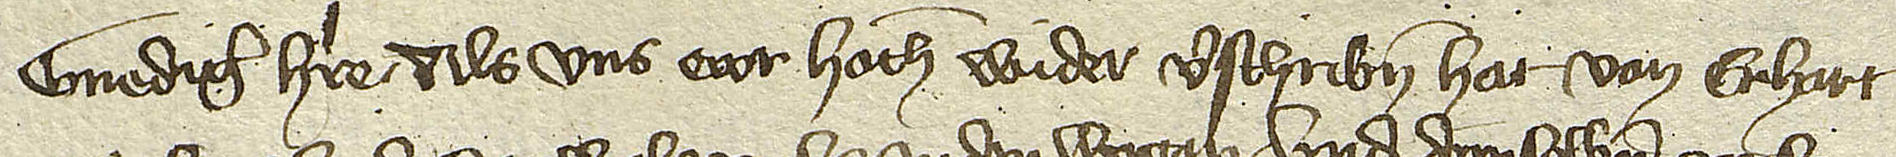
Gnedig* h*re / Als vns ewr hoch* wider v*ſchribn* hat von Erhart
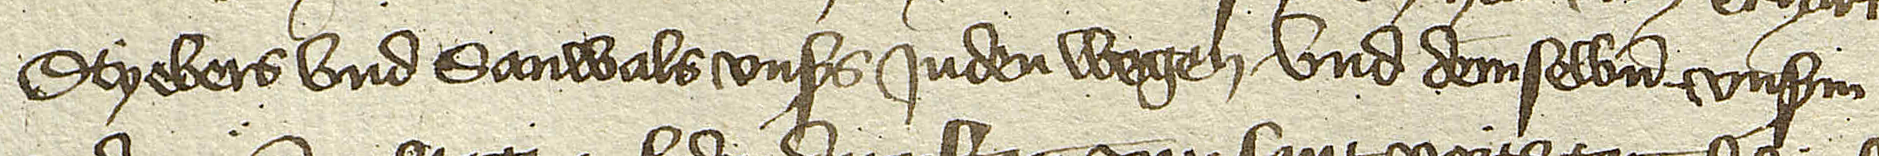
Styebers vnd Sanwals vnſ*s Iuden wegen / vnd demſelbn* ~ vnſ*m
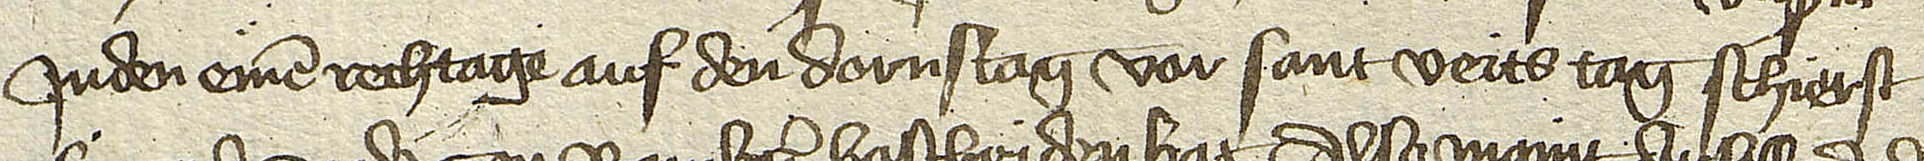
Iuden eine* rechtage auf den dornſtag vor ſant veits tag ſchierſt
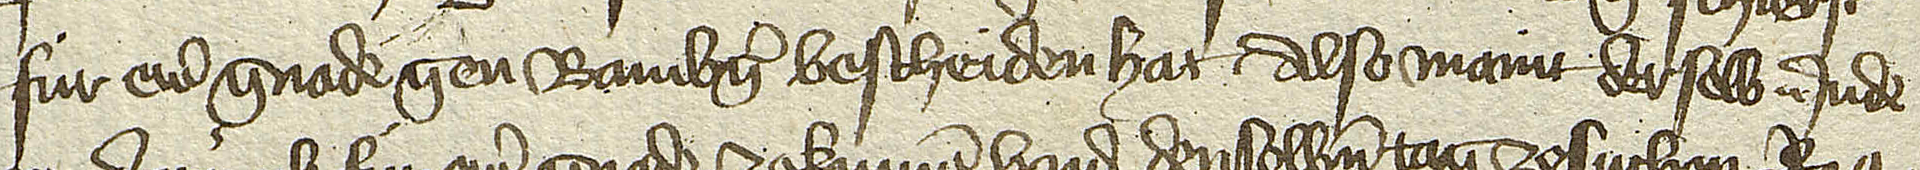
für ew* gnade gen Bambg* beſcheiden hat / Alſo maint derſelb ~ Iude
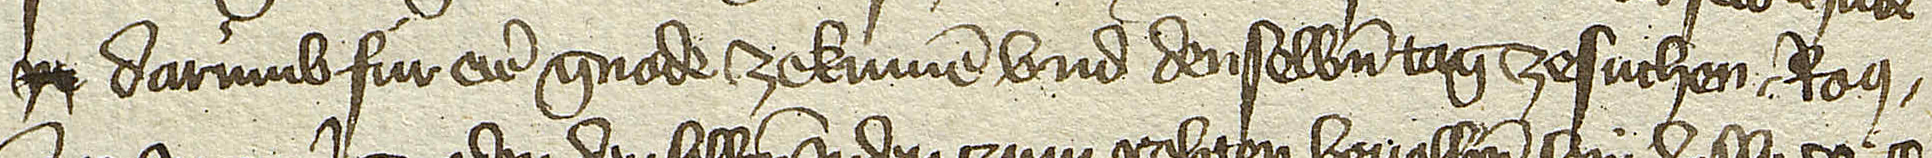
yn darumb für ew* gnade cʒekume* vnd denſelbn* cʒeſuchen / Ro* /
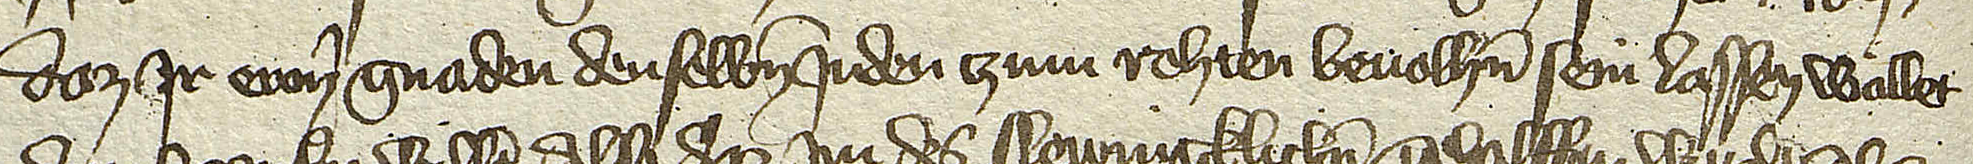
daʒ Ir ewn* gnaden denſelbn* Iuden cʒum rehten beuolhn* ſein laſſen wöllet
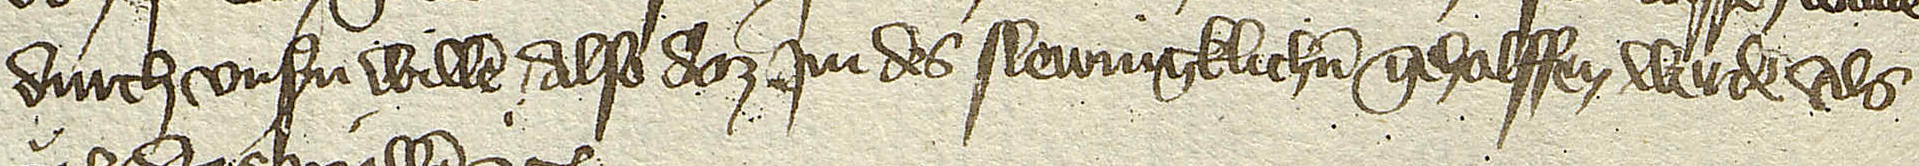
durch vnſ*n wille* / Alſo daʒ Im des ſlewnigklichn* geholffen werde Als
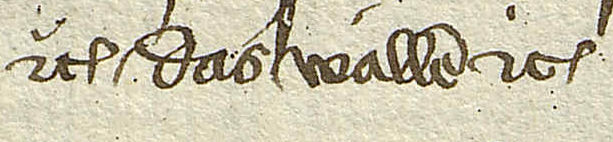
ec* / das wölle* ec*
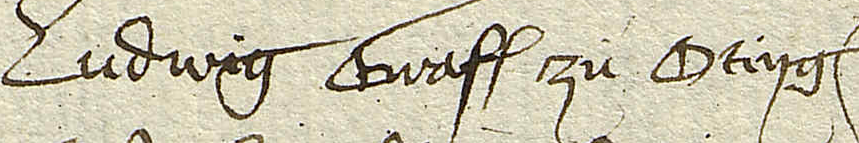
Ludwig Graff cʒu Oting*
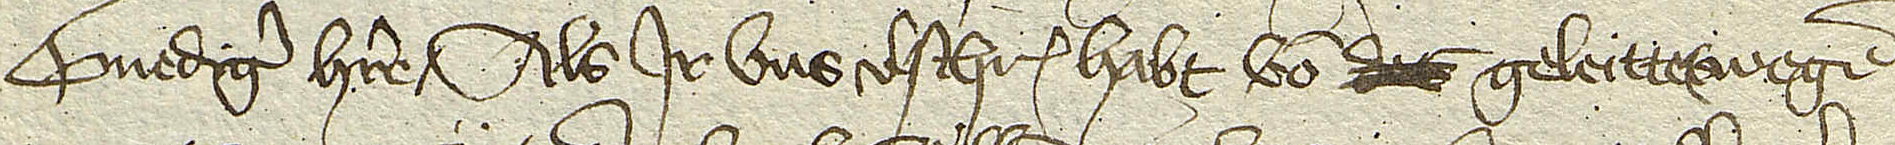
Gnedig* hr*e / Als Ir vns v*ſchr* habt vo* des geleittes wege*
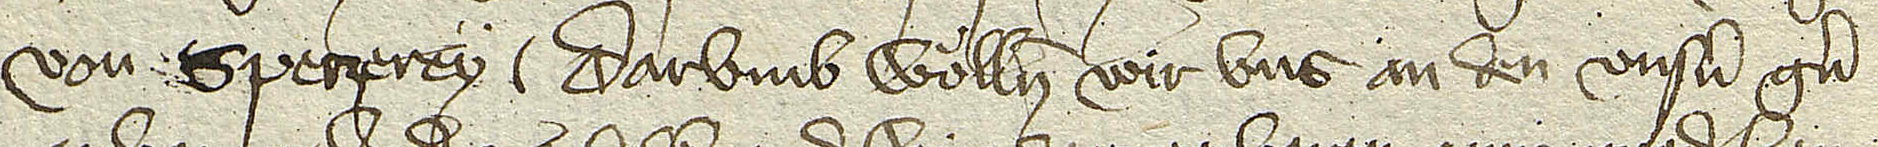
von Spe%ʒerey / darvmb wölln* wir vns an den vnſn* gn*
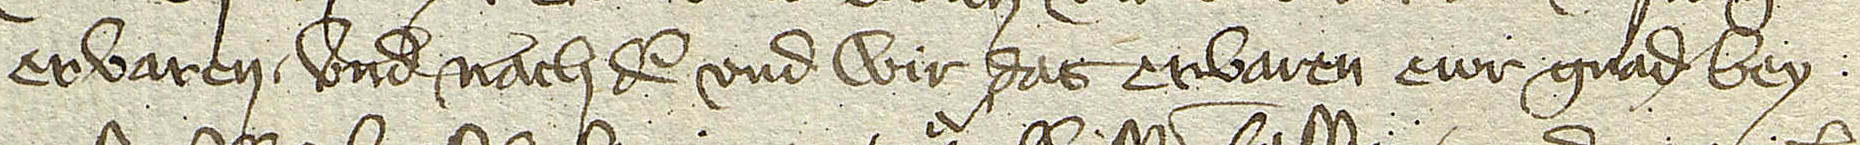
ervaren / vnd nach d* vnd wir das ervaren ewr gnad bey
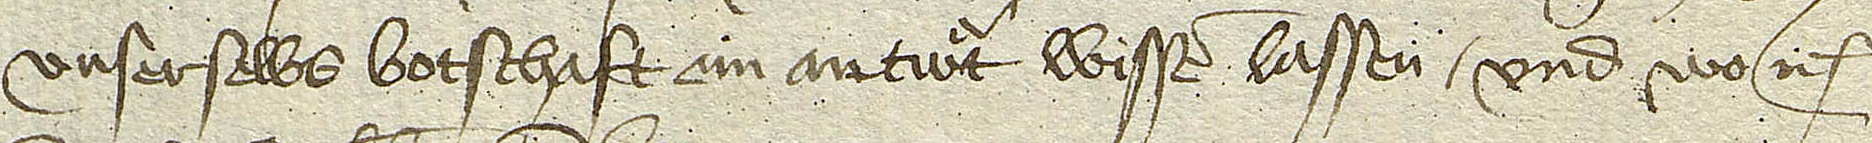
vnſerſelbs botſchaft ein antwt* wiſſe* laſſen / vnd wo ec*
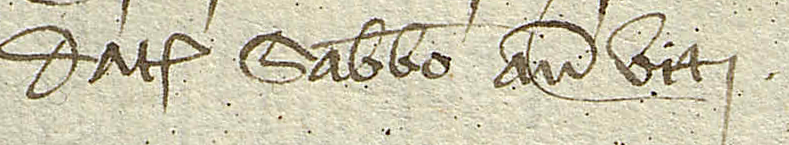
Dat* Sabbo* an* viti* .
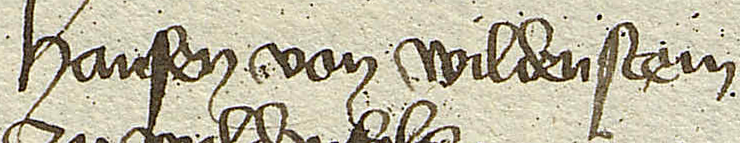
Hanſen von wildenſtein
